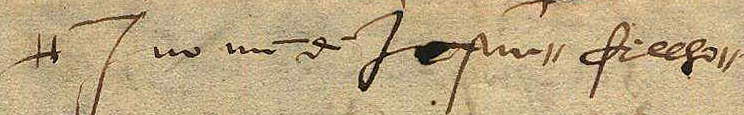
item Jnome de Jesuu // fillho //
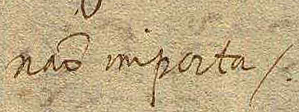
não importa /.
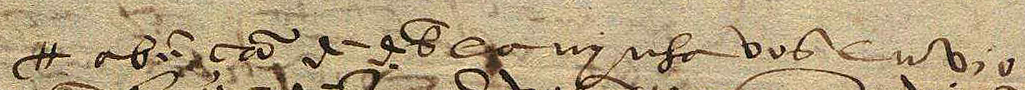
item a bēça de dēs e a mjnha vos envio
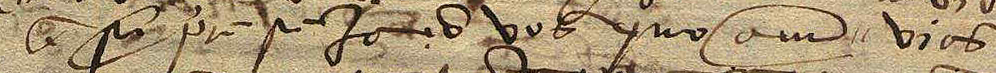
q̄ sēpre seJa cōvosquo am̄ // vi as
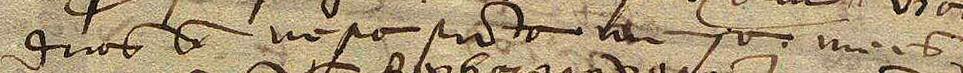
duas q̄ nesa sāta mesa me es
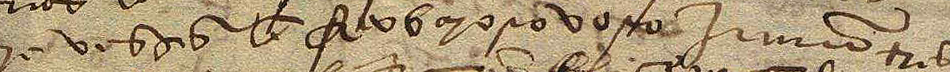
crevestes q̄ frco baroso voso Jrmaõ tres
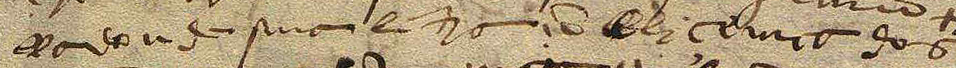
lladou de sua letra cō lljcemça dos
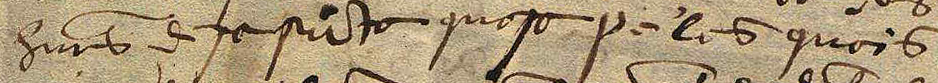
Snr̄s desa sāta quasa pelas quais
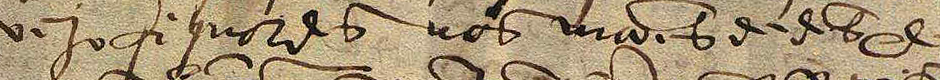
vejo fiquardes nas mans de des̄ e de
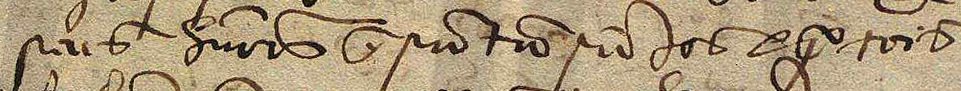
seus Snōrs q̄ sā tā sātos e p̄o tais
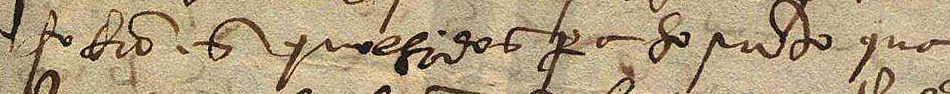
foRā esquolhjdos ꝑa ho sāto qua
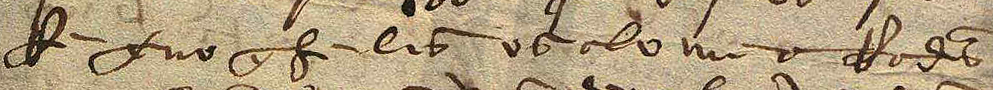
Reguo q̄ heles os alomeaRa des̄
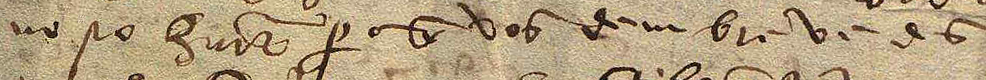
noso Senōr ꝑa q̄ vos dem breve des
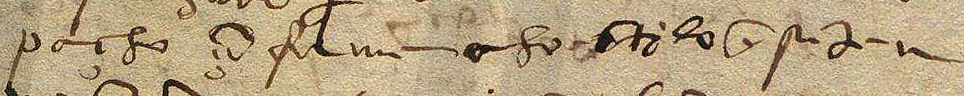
pacho cōforme aho estilo q̄ se tem
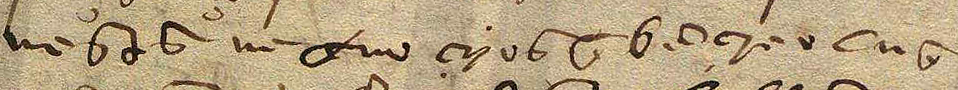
nestes neguocyos q̄ bē creo eu q̄
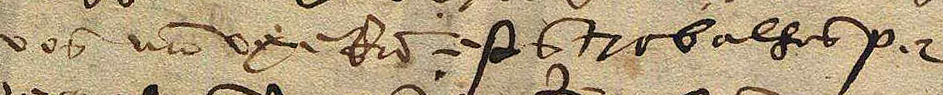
vos nā vexeRā estes trabalhos per
